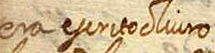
era escrito o liuro
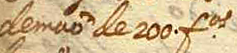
de maõ de 200. f.as.
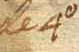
de 4o
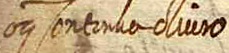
o q̄ Continha o liuro
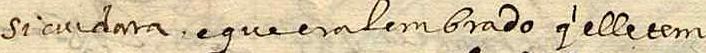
si cuidara, e que era lembrado q̄ elle tem
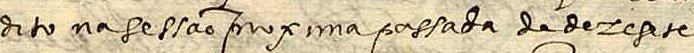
dito na sessaõ proxima passada de dezesete
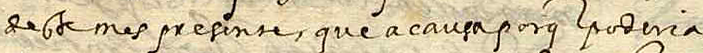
deste mes presente, que a causa por q̄ poderia
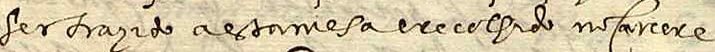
ser trazido a esta mesa e recolhido no Carcere
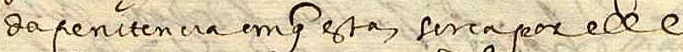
da penitencia em q̄ esta, seria por elle
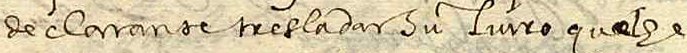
declarante tresladar hū liuro que lhe
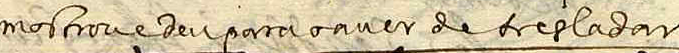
mostrou e deu para o auer de tresladar
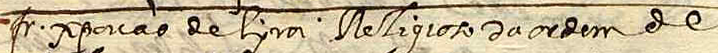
fr. Xpouaõ de lyra Religioso da ordem de
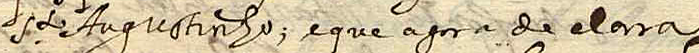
S.to Augustinho; e que agora declara
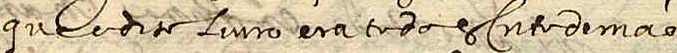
que o dito Liuro era todo esCrito de maõ
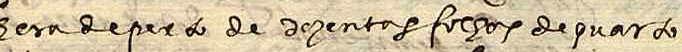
E era de perto de dozentas folhas de quarto
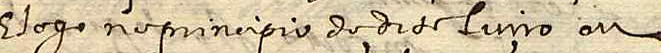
E logo no principio do dito liuro ou
